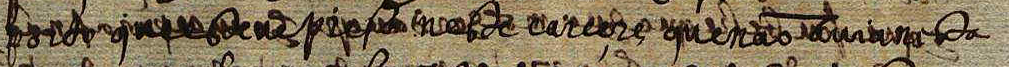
pois que esteue preso neste carcere, que não auia nesta
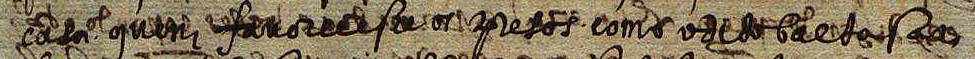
casa quem fauorecesse os presos como o dito baltasar
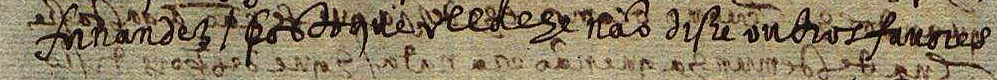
fernandez / posto que ella lhe não disse outros fauores
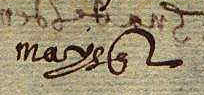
mays q̄
